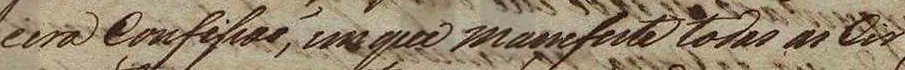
cera confissaõ, em que manifeste todas as Cir
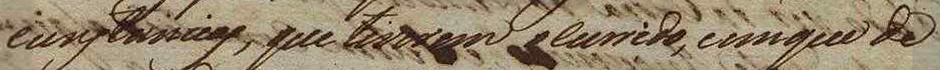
cunstancias, que tiverem ocurrido, e em que de
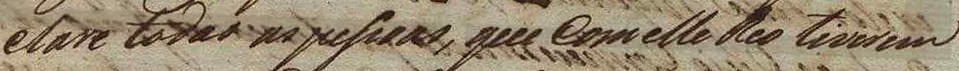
clare todas as pessoas, que com elle Reo tiverem
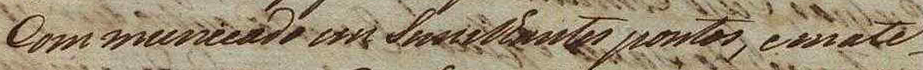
Communicado em Semilhantes pontos, e mate
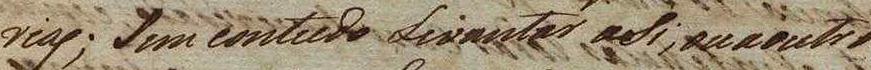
rias; Sem contudo Levantar aSi, ou a outro
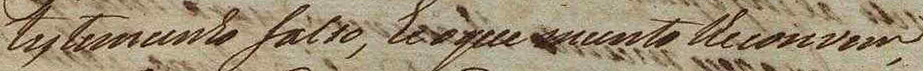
testemunho falso, he o que munto lhe convem,
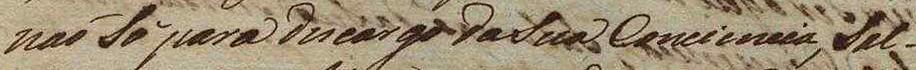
naõ Só para descargo da Sua Conciencia, Sal
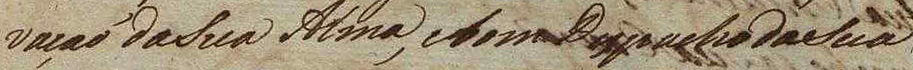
vaçaõ da Sua Alma, e bom Dispacho da Sua
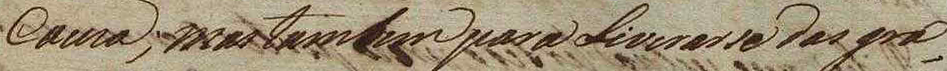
Cauza, mas tambem para Liverarse das gra
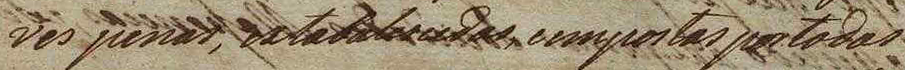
ves penas, estabalescidas, e impostas por todas
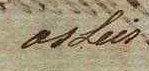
as Leis
